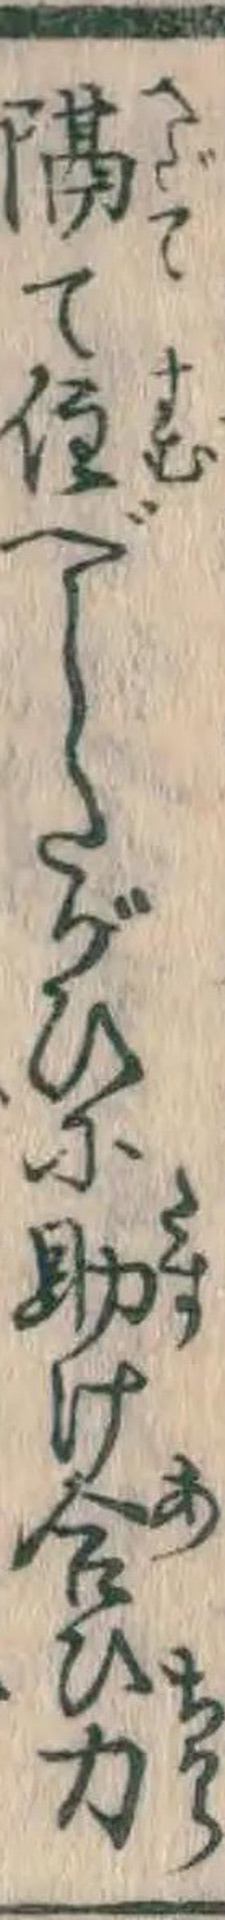隔て住べしたがひに助け合ひ力
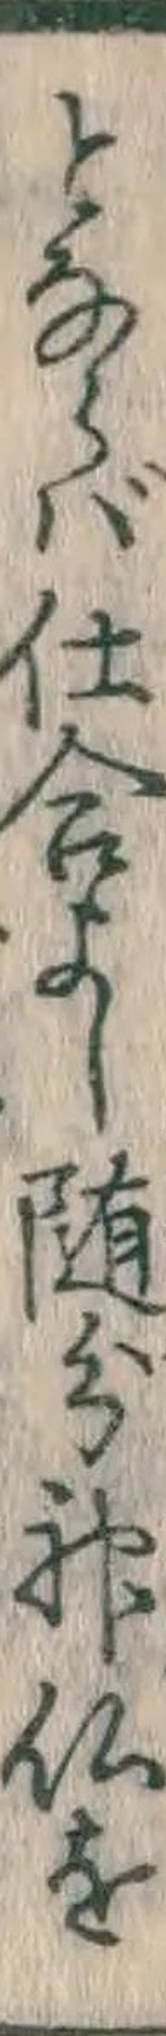とならば仕合よし随分神仏を
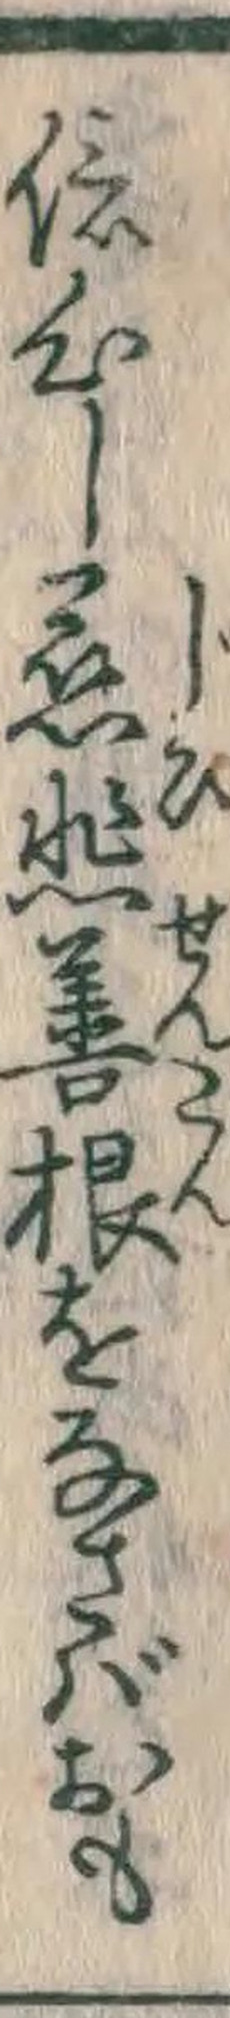信心し慈悲善根をなさばおも
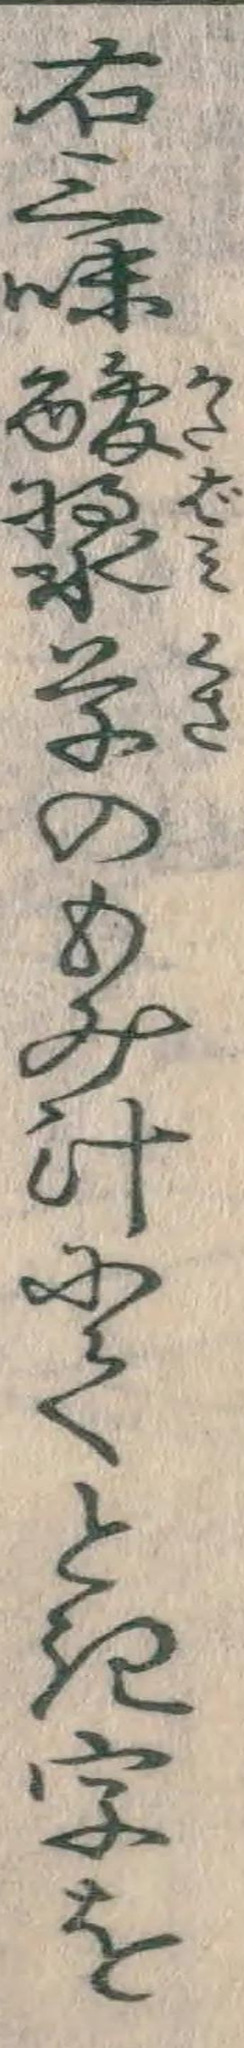右三味酸漿草のもみ汁にてとき字を
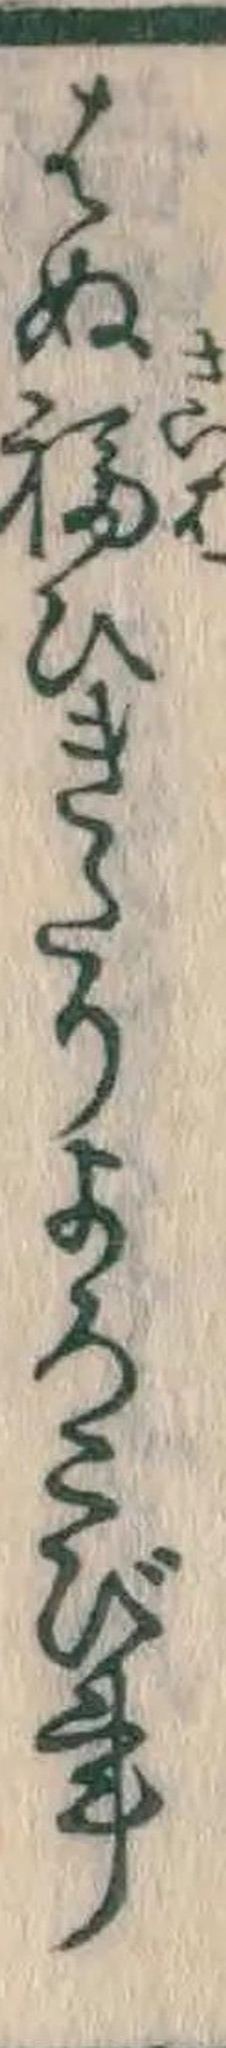はぬ福ひきたりよろこび事
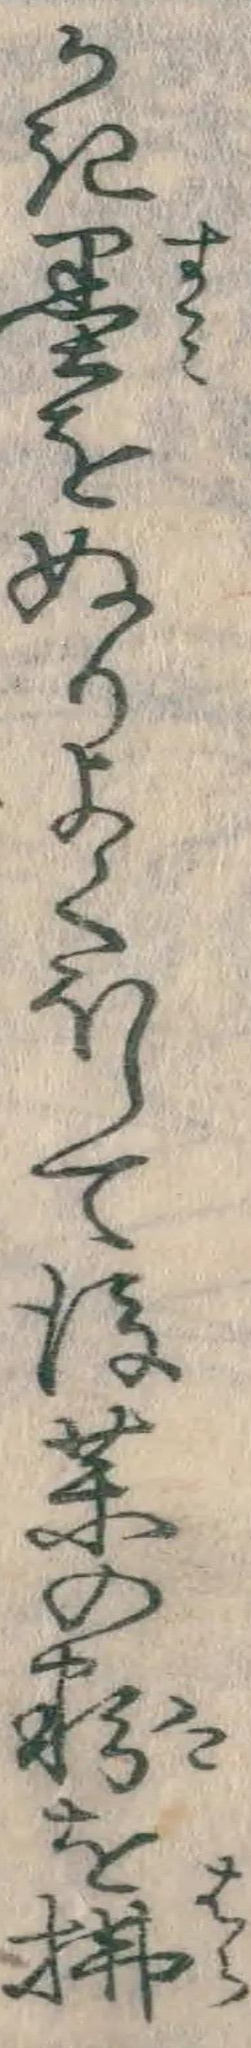かき墨をぬりよくほして後薬の粉を払
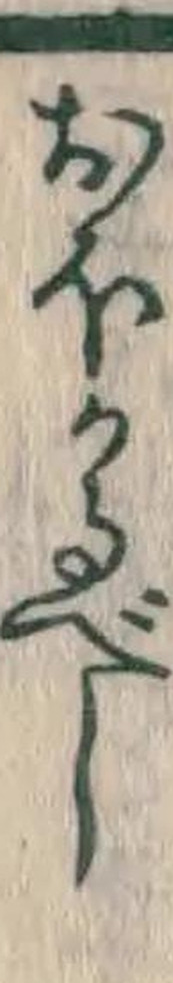おほかるべし
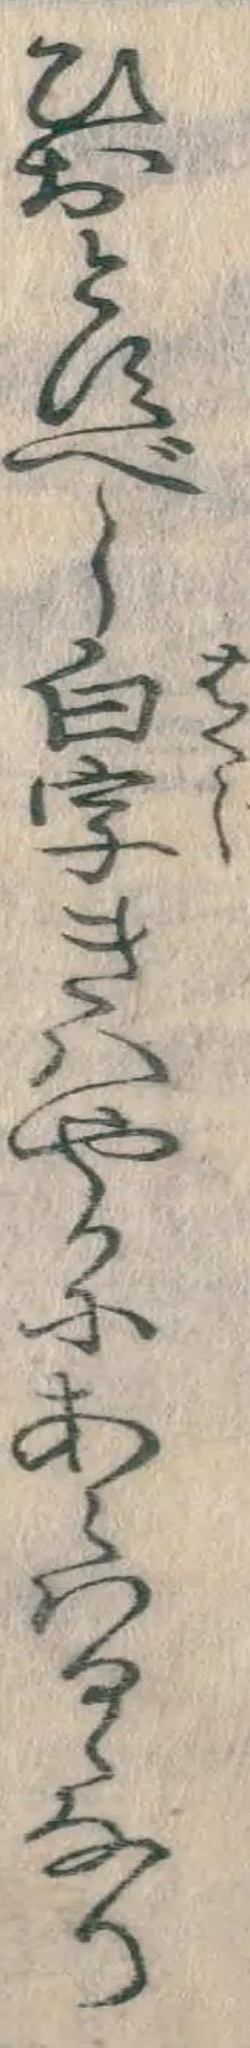ひおとすべし白字きはやかにあらはるゝなり
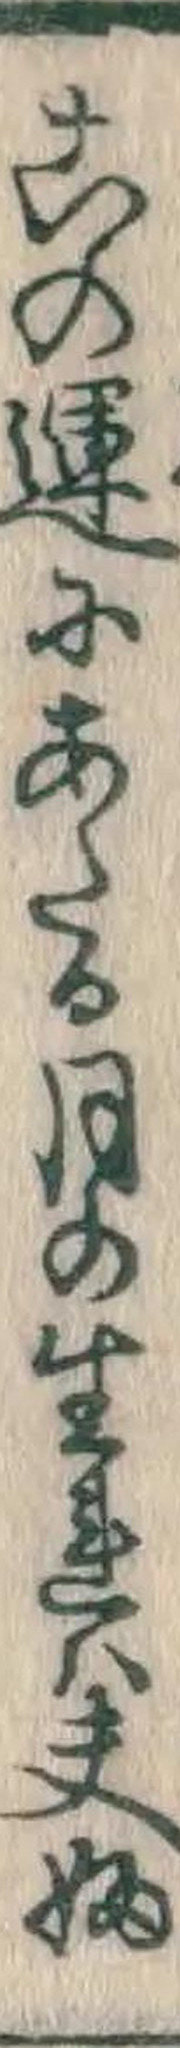この運にあたる月の生れは夫婦
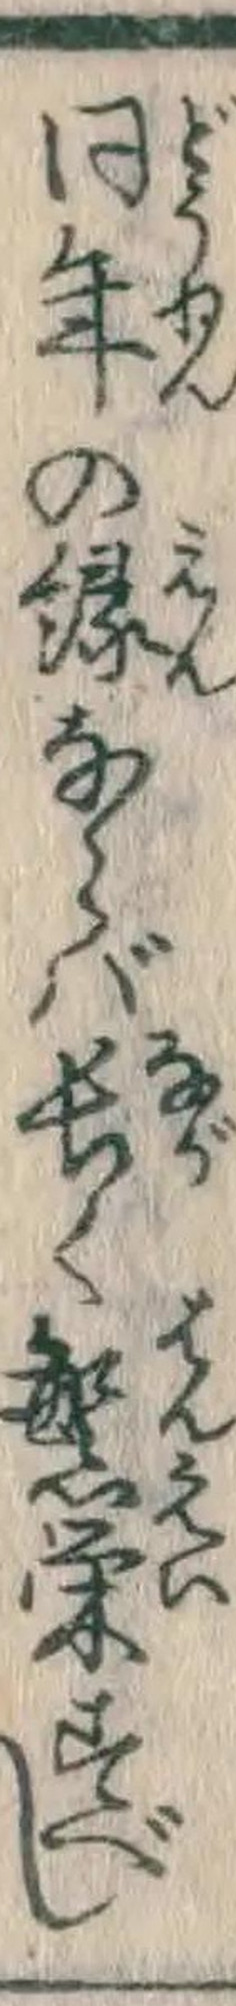同年の縁ならば長く繁栄すべし
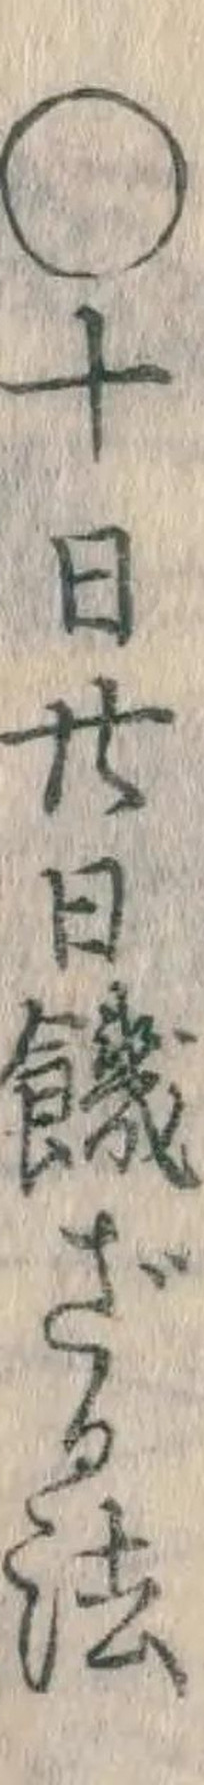○十日廿日饑ざる法
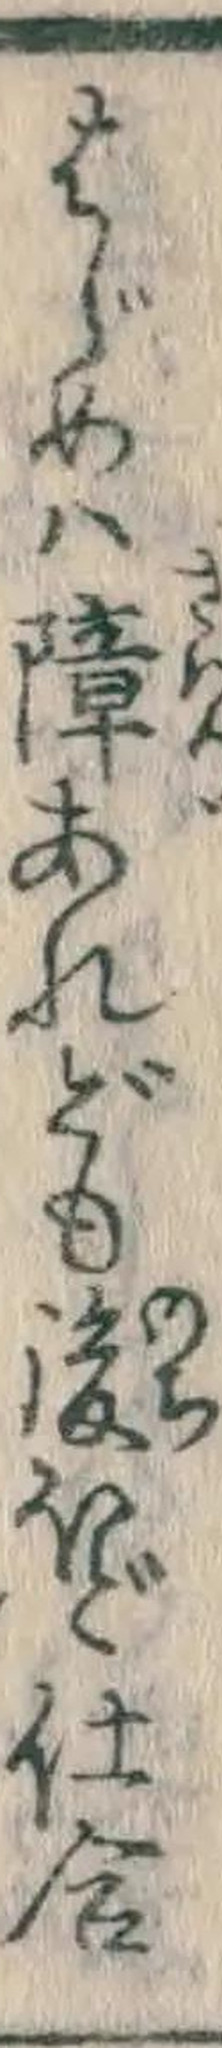はじめは障あれども後ほど仕合
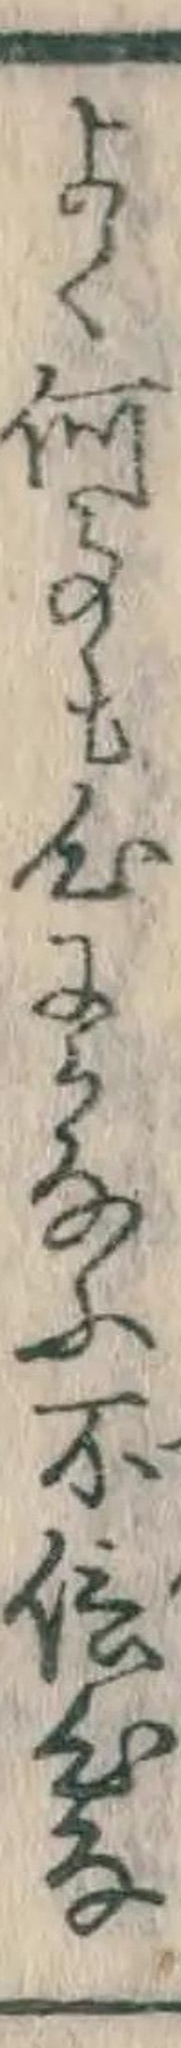よく何事も心にかなふ不信心な
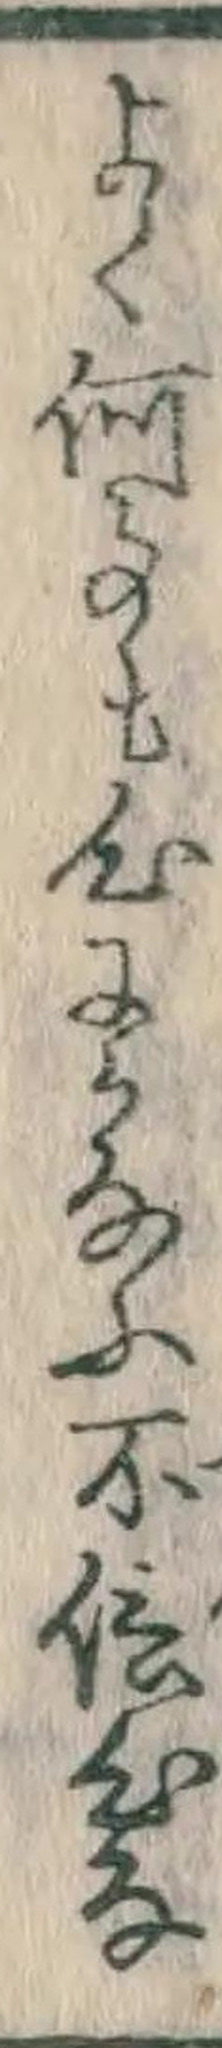よく何事も心にかなふ不信心な
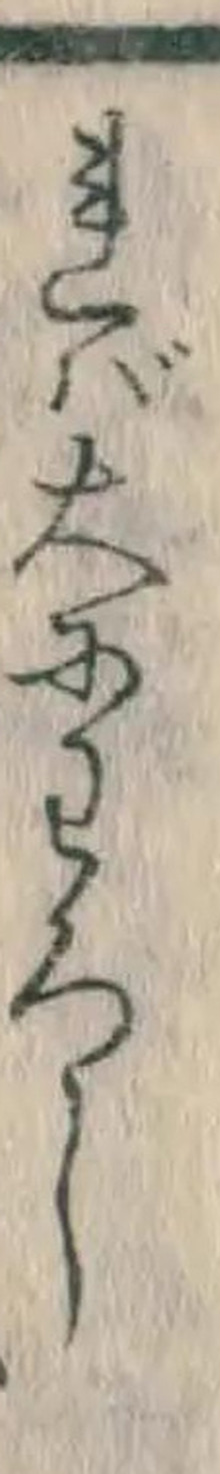れば大にわろし
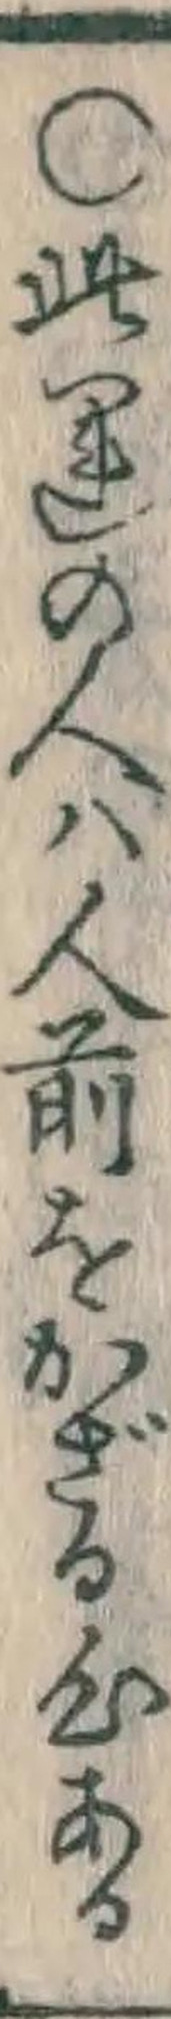○此運の人は人前をかざる心ある
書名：広益秘事大全 3巻. [2]
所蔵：国立国会図書館 National Diet Library, JAPAN
